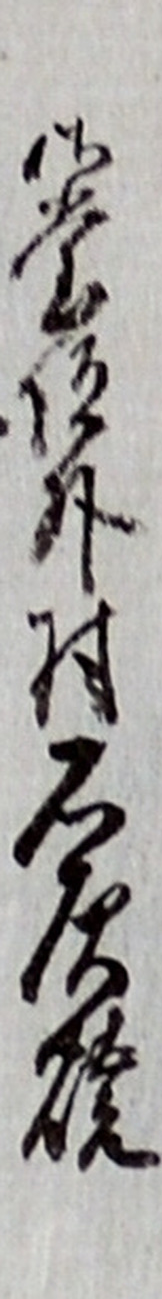御堂垣外村石灰焼
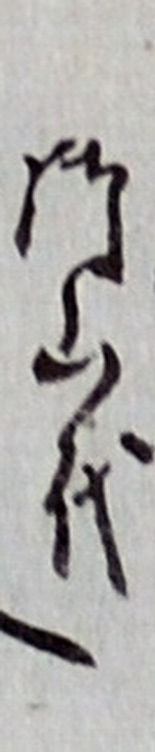御山代
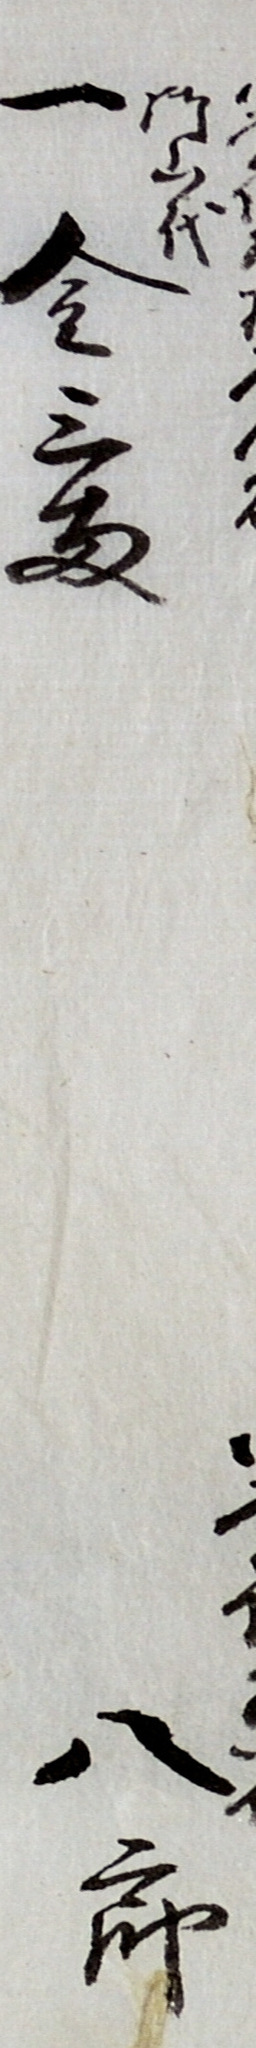一金三両八郎
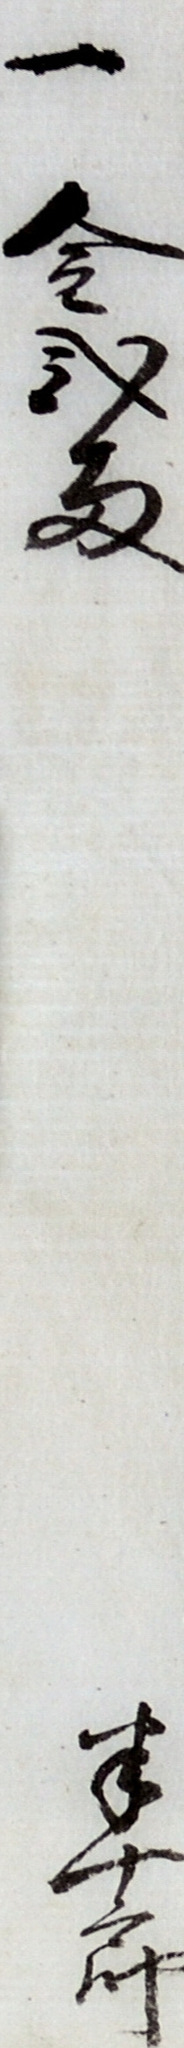一金弐両半十郎

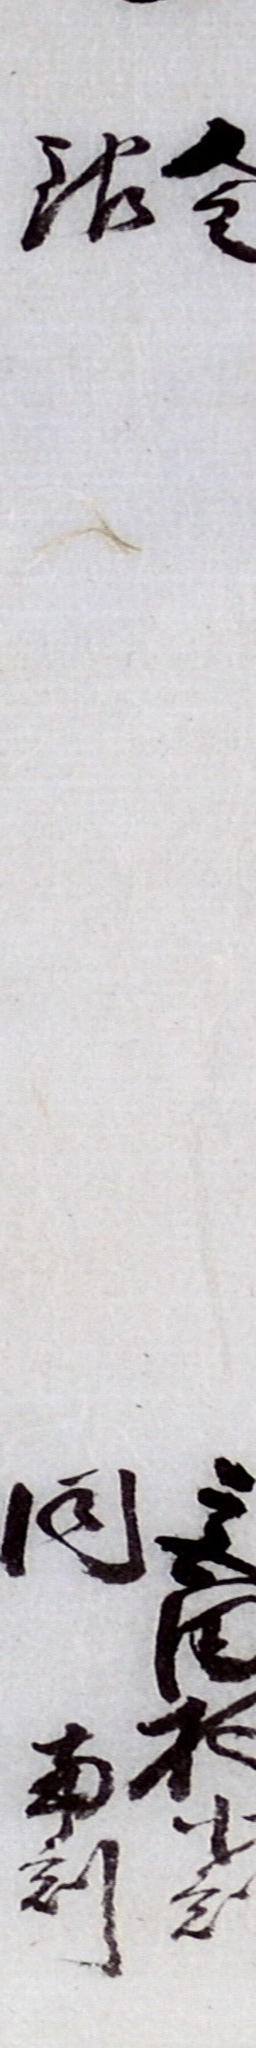銀同南割
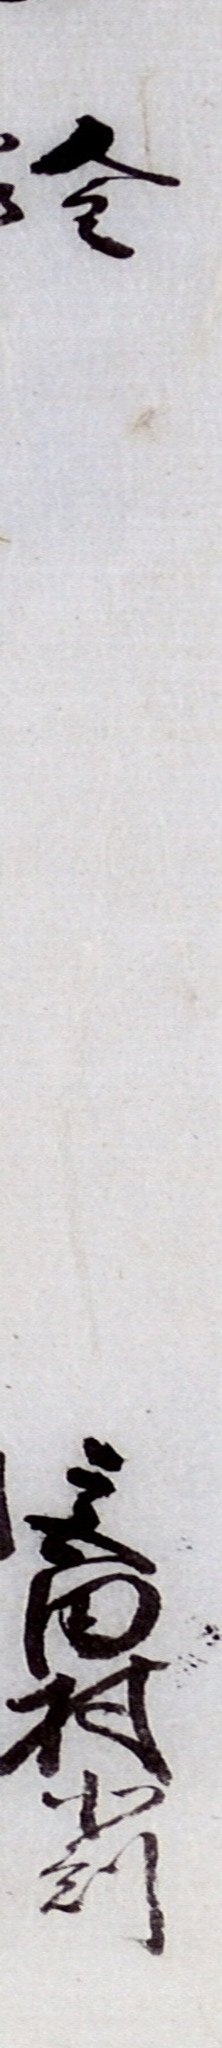一金宮田村北割
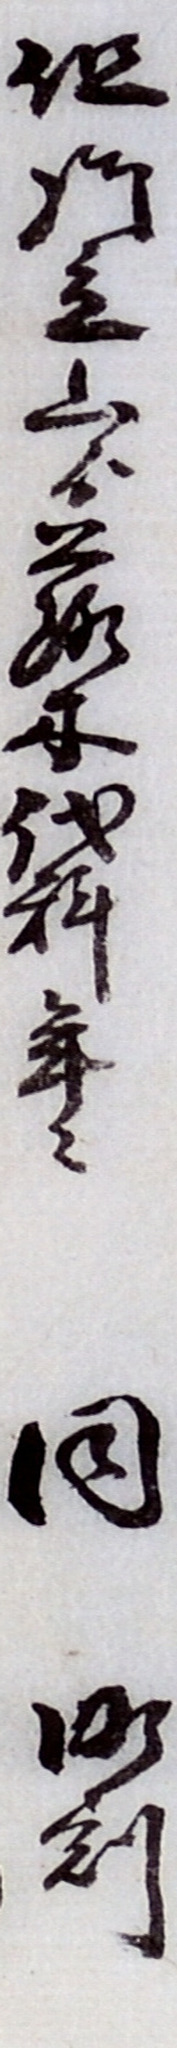但御立山ゟ落木代料年々同町割
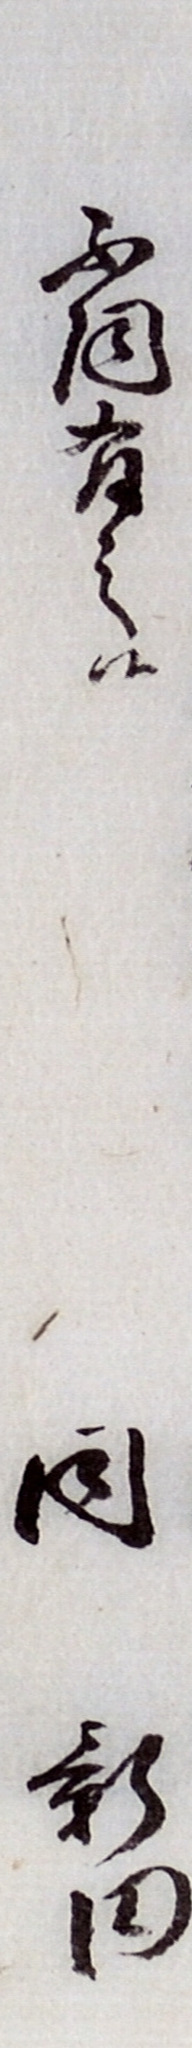不同有之候同新田
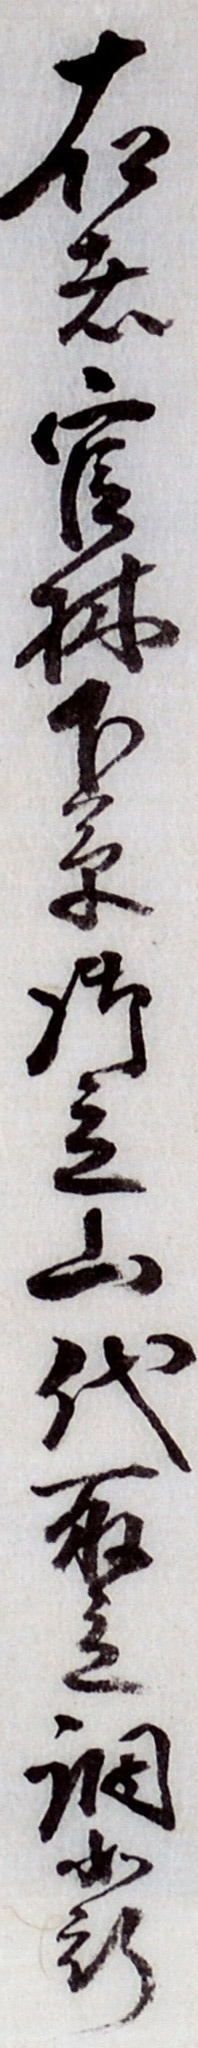右者官林下草御立山代取立調如斯
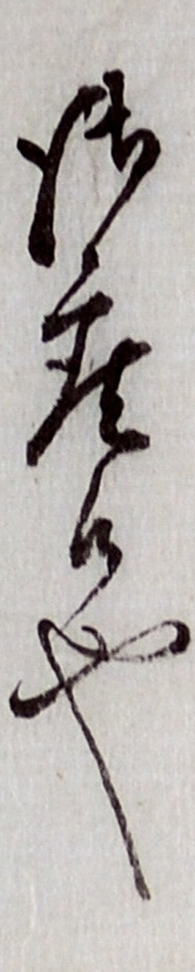御座候也
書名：官林下草御山代取立帳
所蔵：伊那市立高遠町図書館・合同会社AMANE
